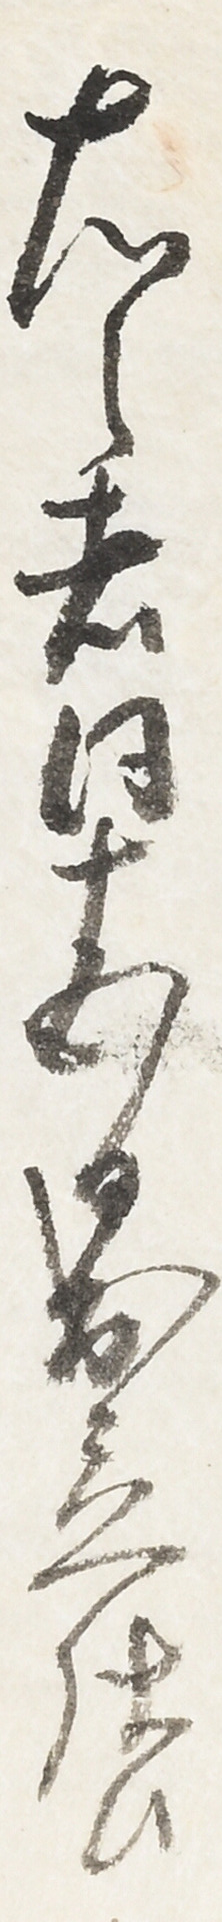右之者同十五日出立仕候
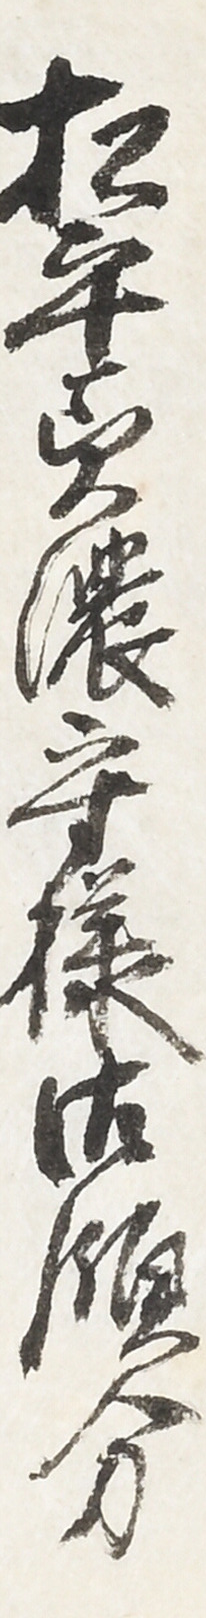松平美濃守様御領分
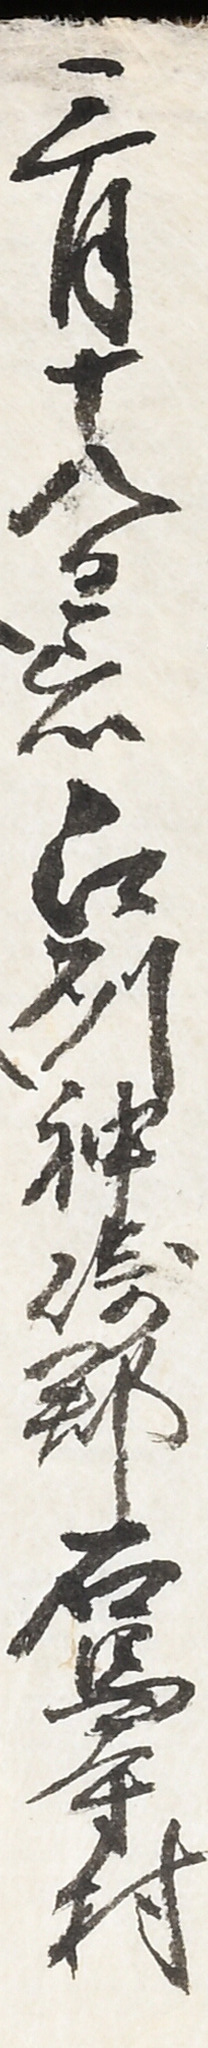三月十八日着江州神崎郡石馬寺村
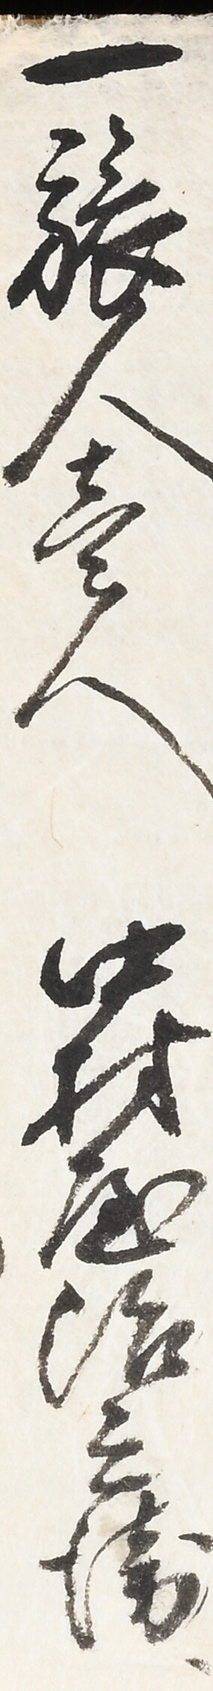一旅人壱人中村屋治兵衛、
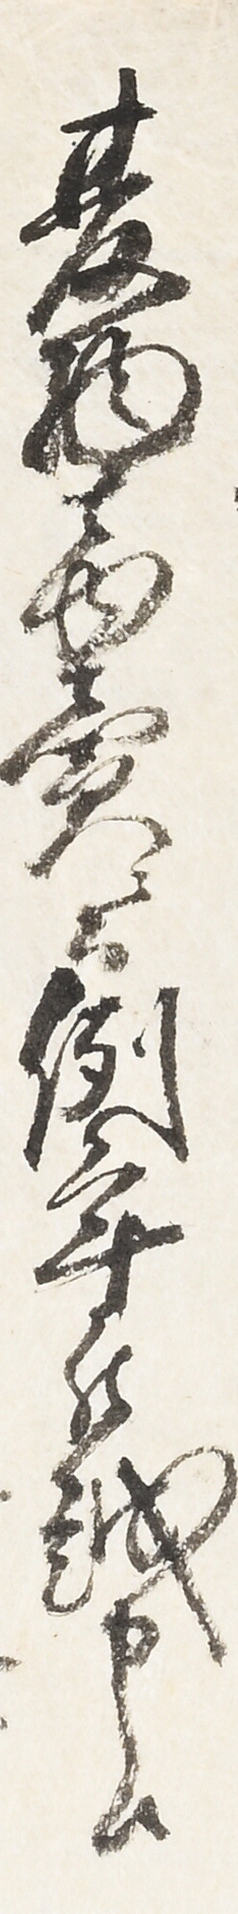夏物商売ニ而例年罷越申候
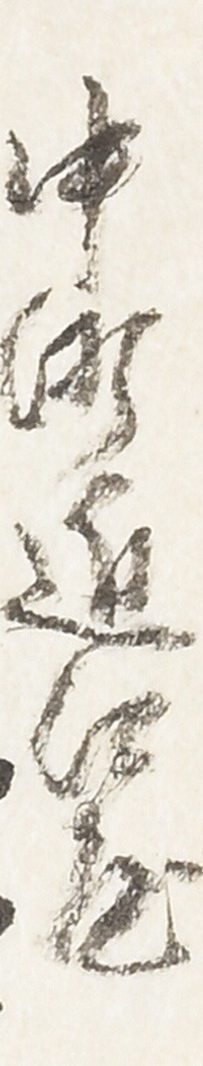中町近江屋
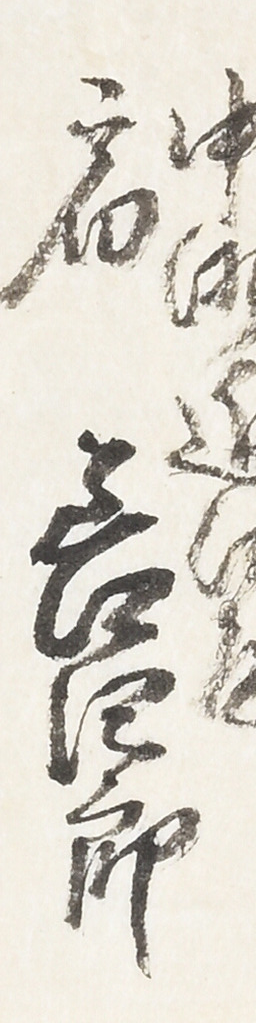宿善四郎
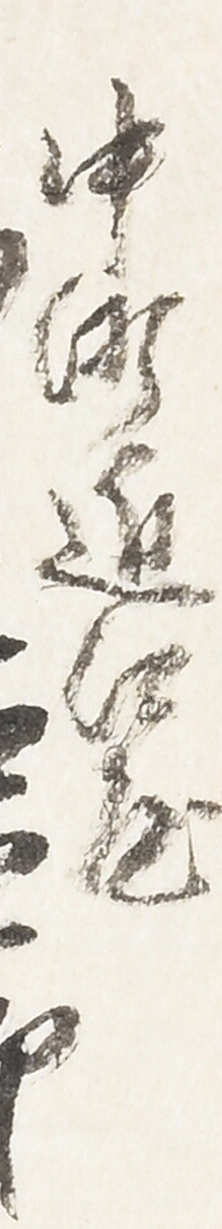中町近江屋
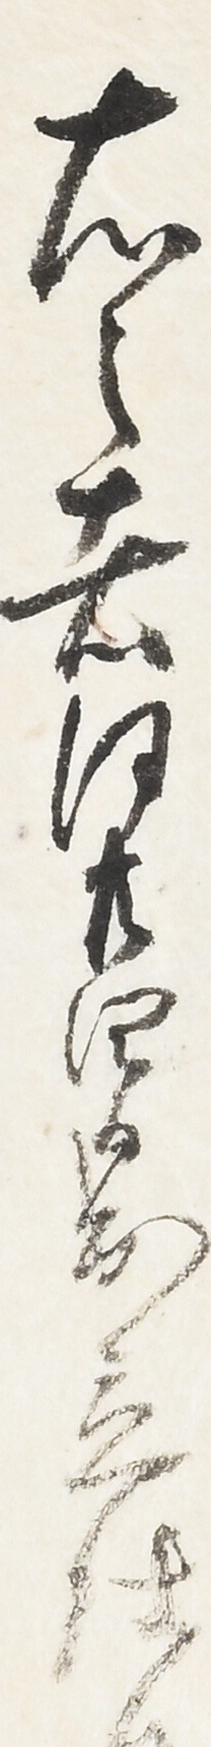右之者同廿四日出立仕候
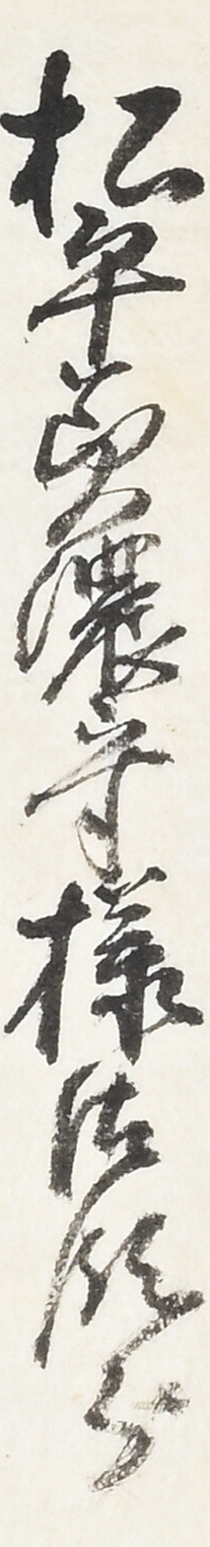松平美濃守様御領分
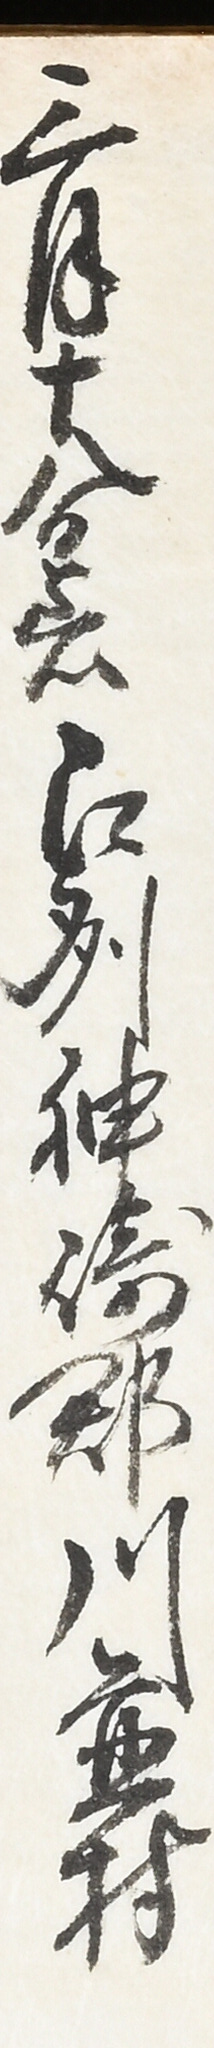三月十八日着江州神崎郡川並村
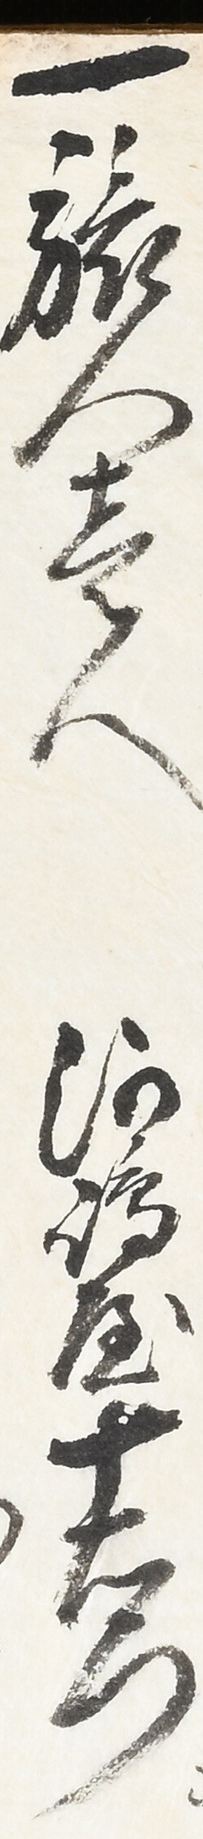一旅人壱人河嶋屋十右衛門。
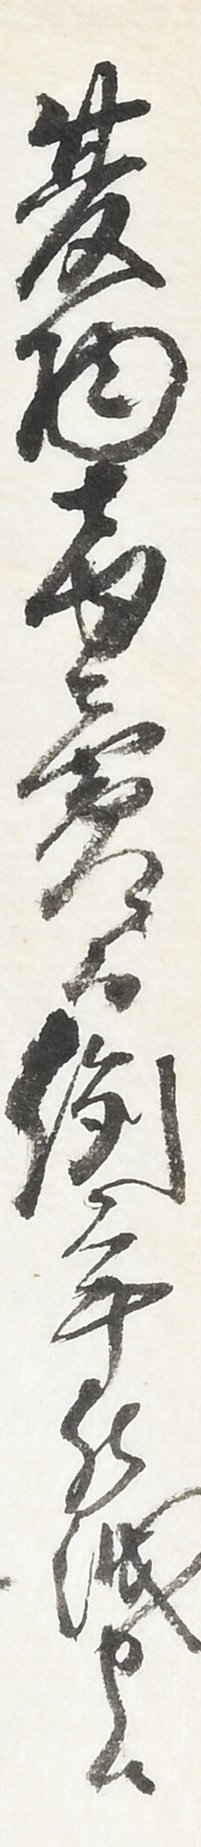夏物商売ニ而例年罷越申候
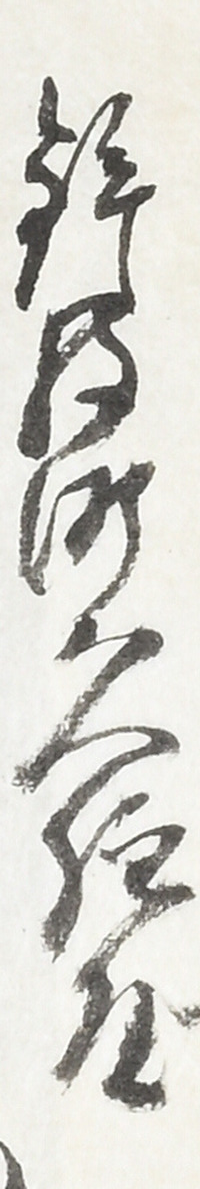鉾持町久住屋
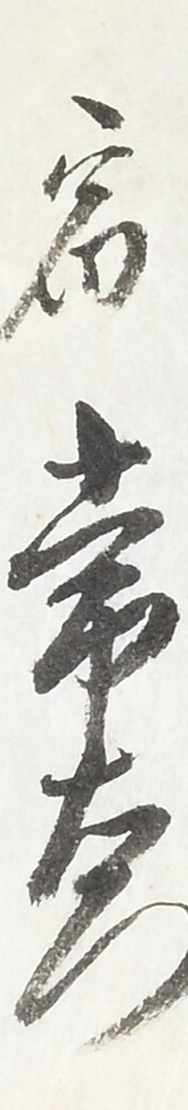宿常右衛門
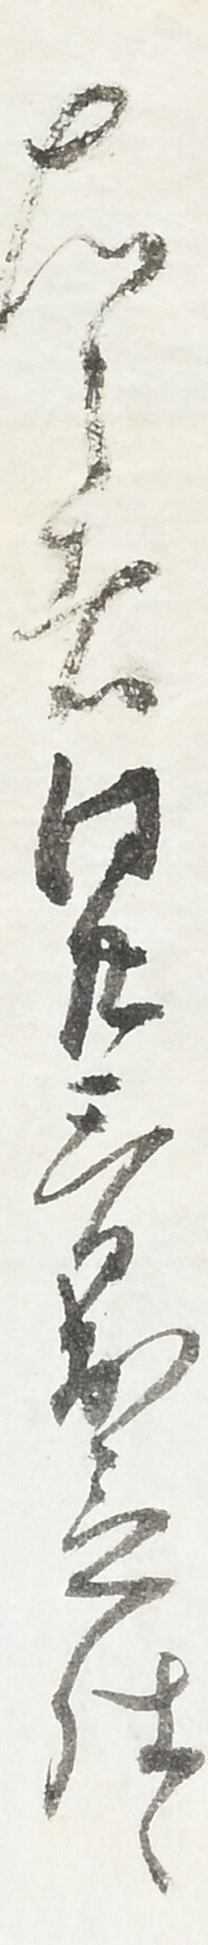右之者同廿三日出立仕候
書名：旅人泊控帳
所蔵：伊那市立高遠町図書館・合同会社AMANE
